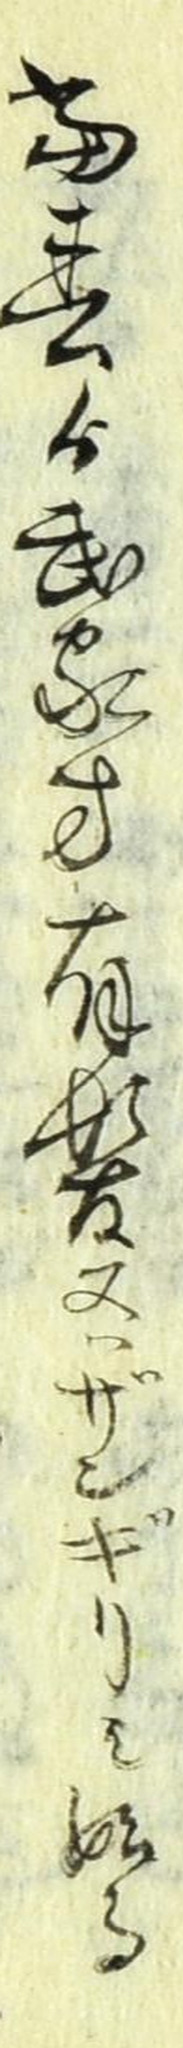当春ゟ武家方有髪又はザンギリと始る
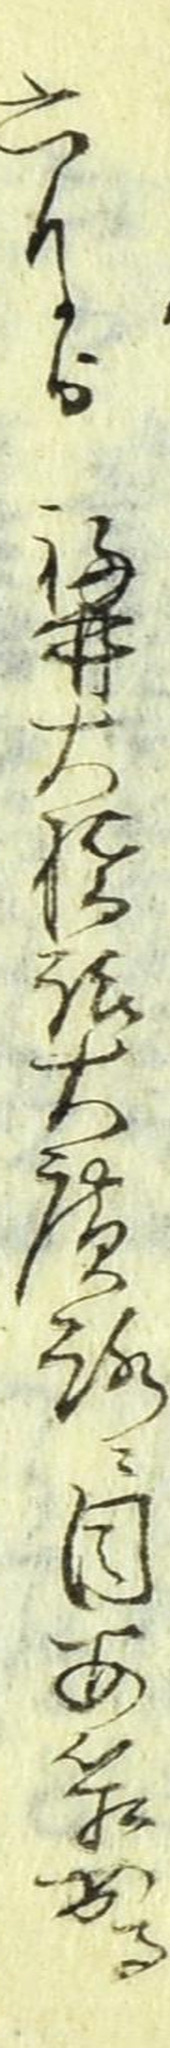六月ゟ福井大橋詰大広路に目安箱出る

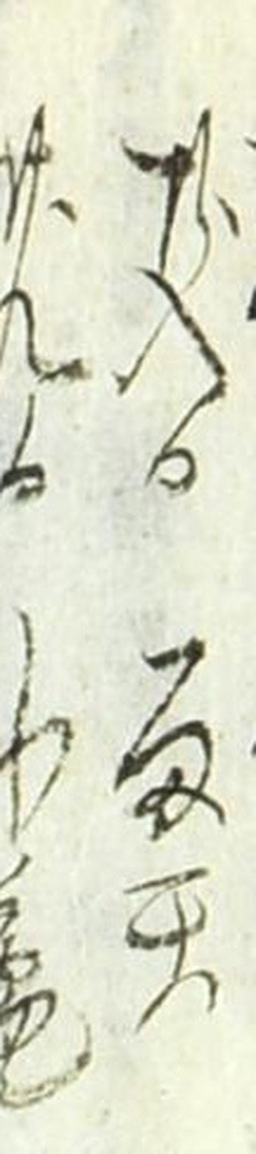十一日雨天
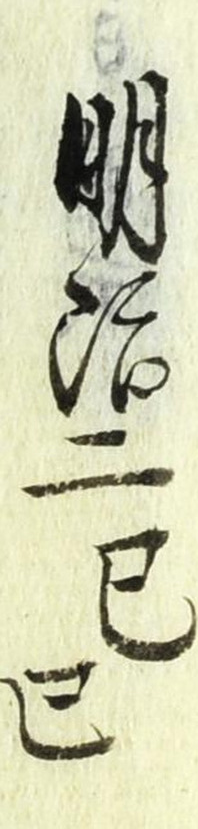明治二己巳
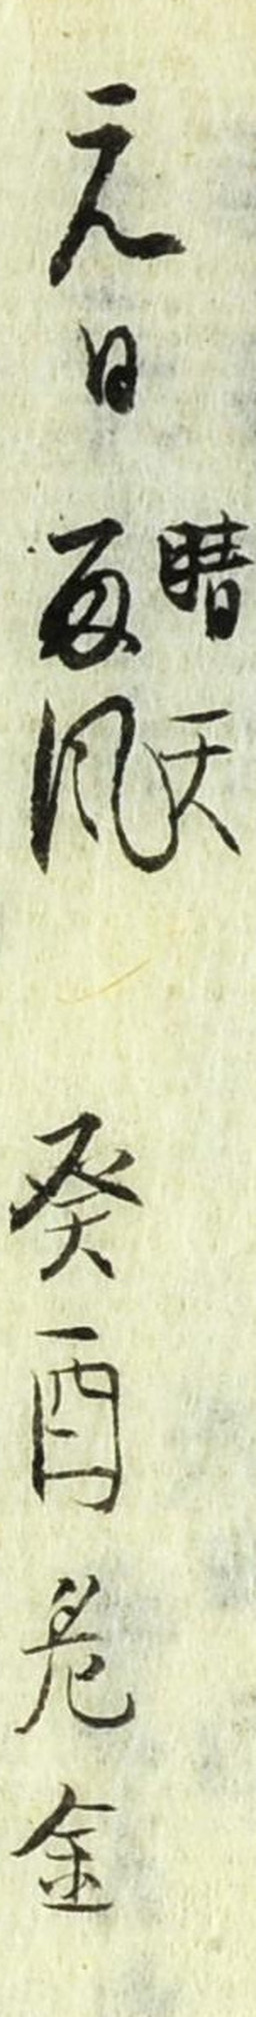元日雨風癸酉危金
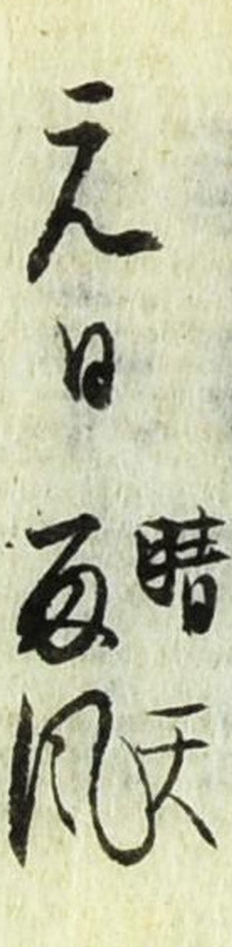二日雨風
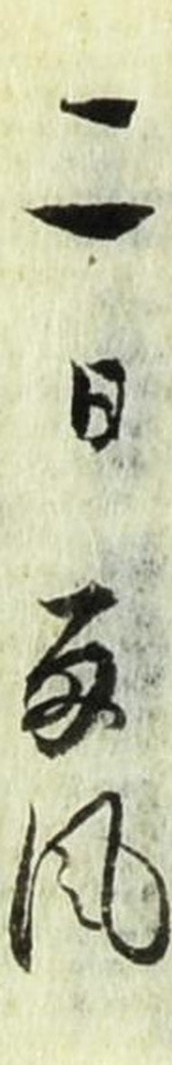二日雨風
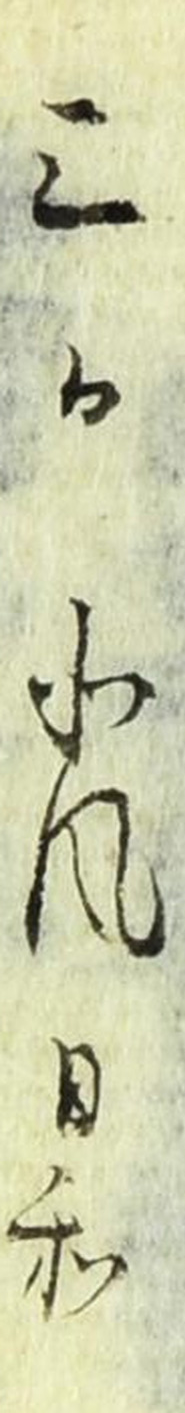三日北風日和
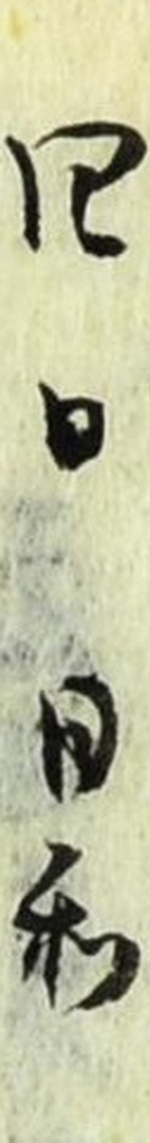四日日和
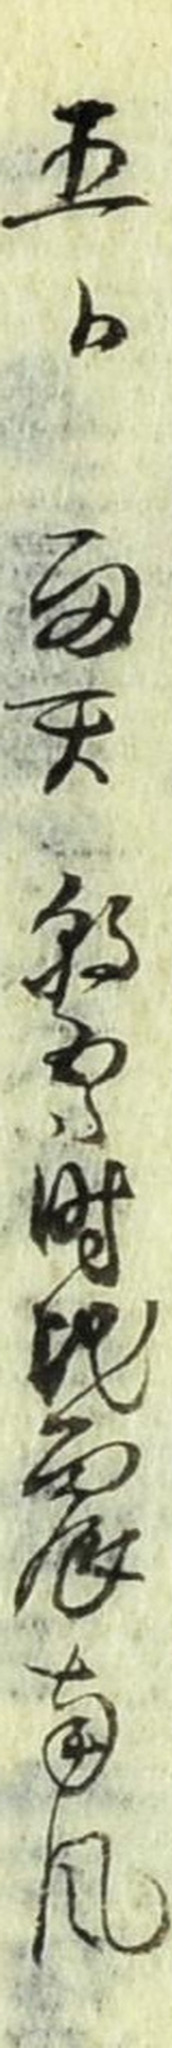五日雨天朝五ツ時地震南風
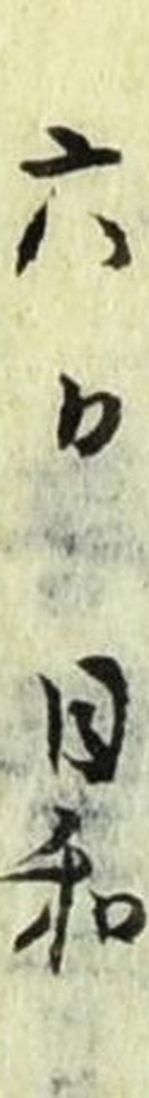六日日和
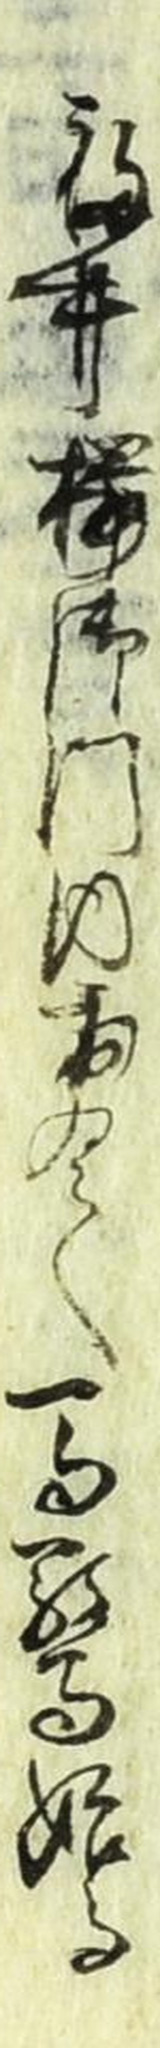福井桜御門内おゐて馬驚始る
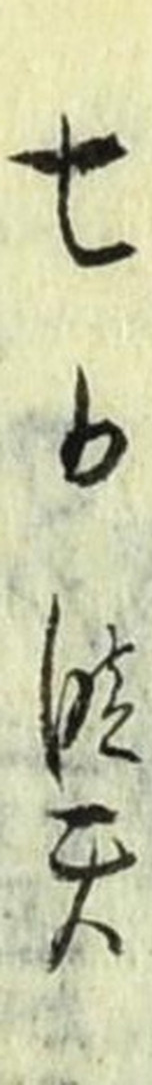七日晴天
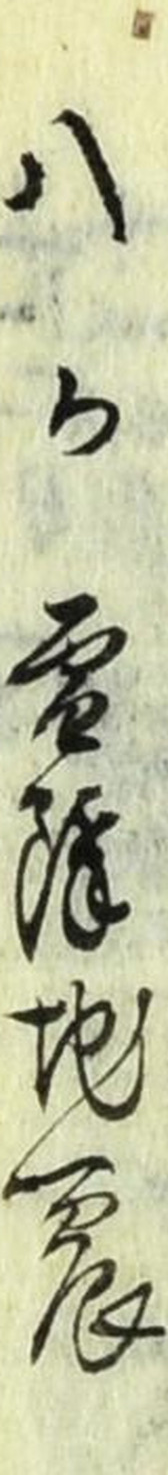八日雪降地震
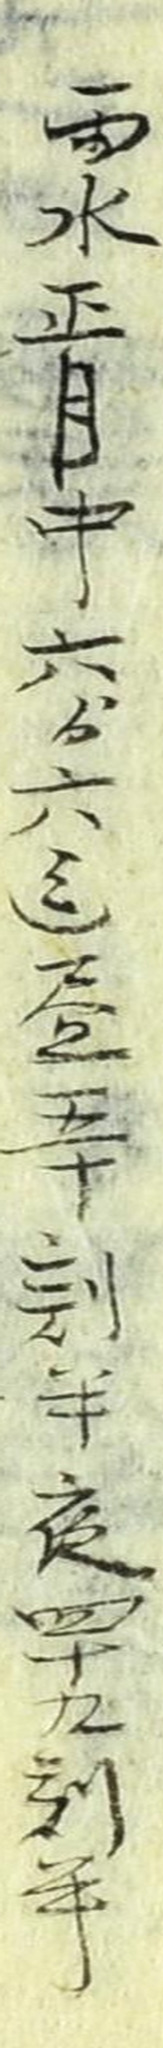雨水正月中六ゟ六迄昼五十刻半夜四十九刻半
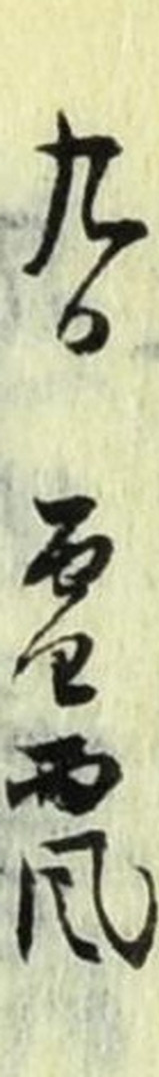九日雪西風
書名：（日記）
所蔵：福井県文書館 Fukui Prefectural Archives
